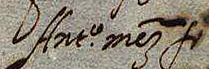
Ant.o mez jr
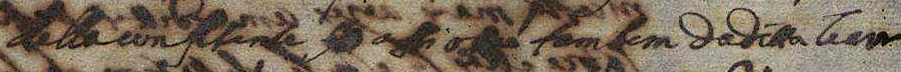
della confitente q̄ assi o saõ tambem da ditta leanor
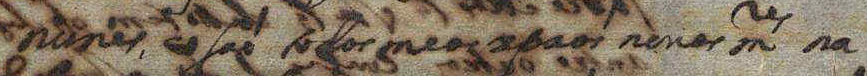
nunes, e o saõ todos meos xpaõs nouos mres na
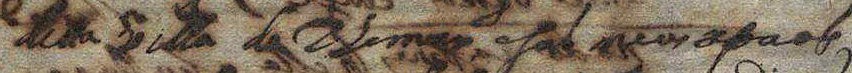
ditta villa de Thomar e saõ meos xpaõs
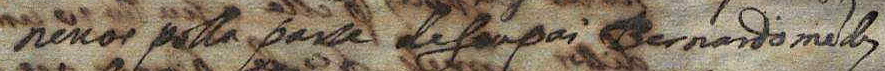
nouos polla parte de seu pai Bernardo mēdez
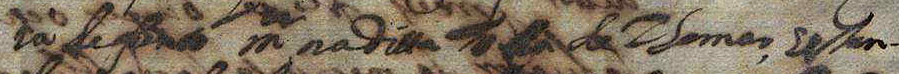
ia defunto mor na ditta villa de Thomar E estan
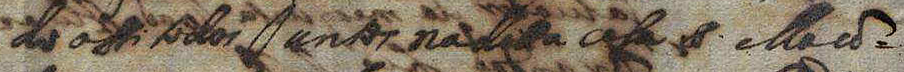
do assi todos Juntos na ditta casa & ella cō
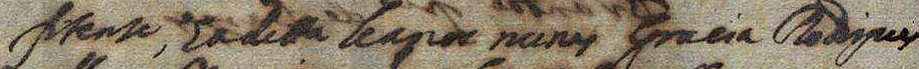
fitente, E a ditta Leanor nunes Gracia Rodrigues
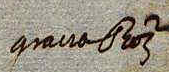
gracia Roīz
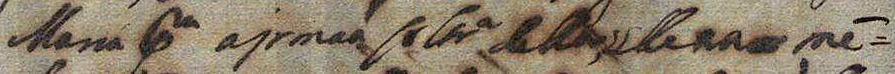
Maria pra a jrmaā soltra della Ellena mē
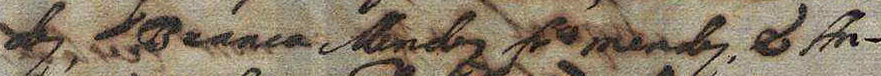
des Branca Mendez frco mendes, & An
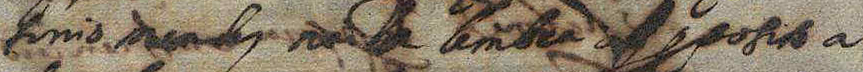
tonio mendes naõ lhe lembra o _ ꝓposito a
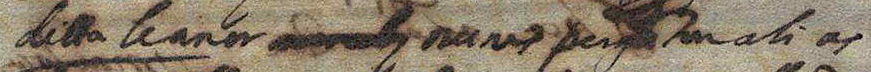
ditta leanor mendez nunes pergūtou ali as
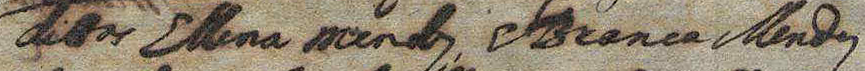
dittas Ellena mendez E Branca Mendez
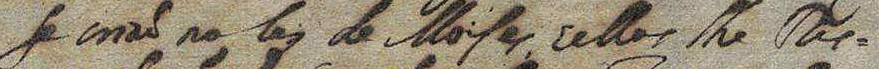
se criaõ na ley de Moises E ellas lhe Res
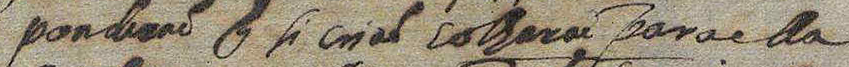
ponderaõ q̄ si criaõ E olharaõ para ella
